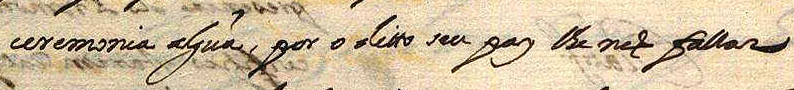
ceremonia alguā, por o ditto seu pay lhe naõ fallar
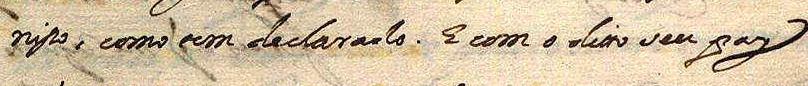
nisso, como tem declarado. E com o ditto seu pay
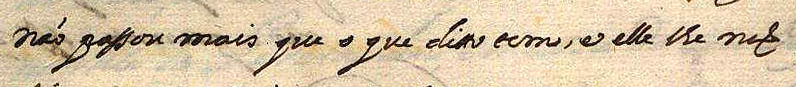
naõ passou mais que o que ditto tem, e elle lhe naõ
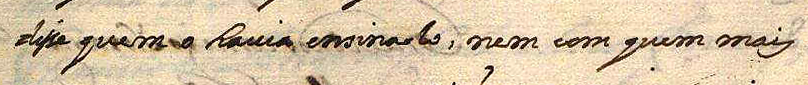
disse quem o hauia ensinado, nem com quem mais
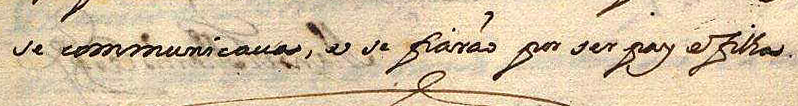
se communicaua, e se fiarão por ser pay e filha.
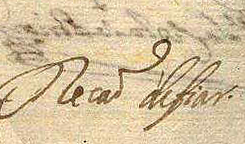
Rezaõ de fiar.
